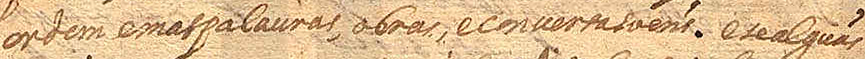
ordem em as palauras, obras, e conuersasoens̄. e se alguas̄
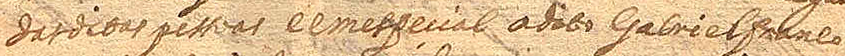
das ditas pessoas e em espeçial o dito Gabriel franco
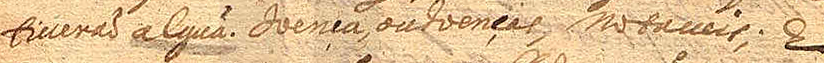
tiueraõ alguā. doença, ou doenças, notaueis; E
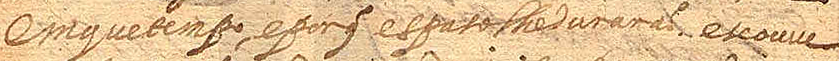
em que tempo, e por q̄ espaso lhe duraraõ. e se ouue
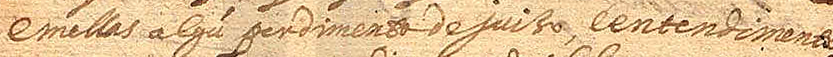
em ellas algū perdimento de juizo, e entendimento
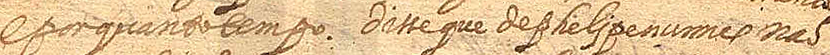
e por quanto tempo. disse que de phelipe nunnes naõ
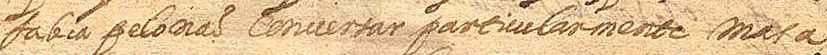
sabia pelo naõ conuersar particularmente mas a
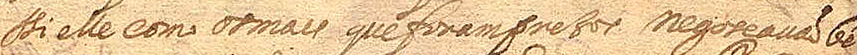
ssi elle como os maes que foram prezos negoseauaõ bē
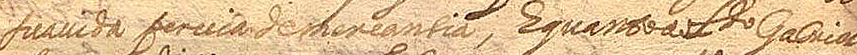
sua uida per uia de mercansia, E quanto ao Ldo Gabriel
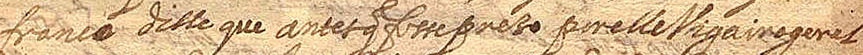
franco disse que antes q̄ fosse prezo por elle Vigairo geral
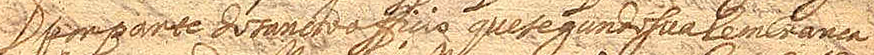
por parte do sancto offiçio que segundo sua lembrança
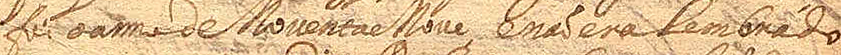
foi o anno de Nouenta e Noue, e naõ era lembrado
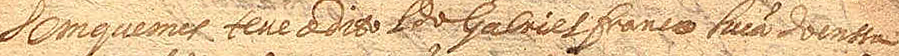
em que mes teue o dito Ldo Gabriel franco huā doenssa
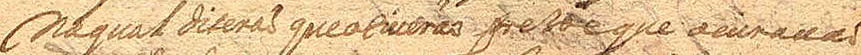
na qual diseraõ que o tiueraõ prezo e que o curauaõ
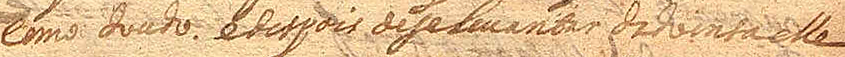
como doudo. e despois de se leuantar da doensa elle
